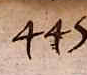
445
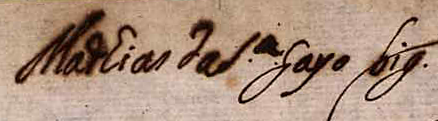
Mathias da S.a Gayo big.
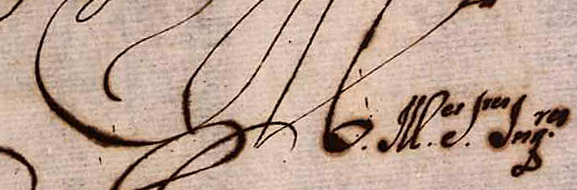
Mt.o Ill.es S.res Inq.res
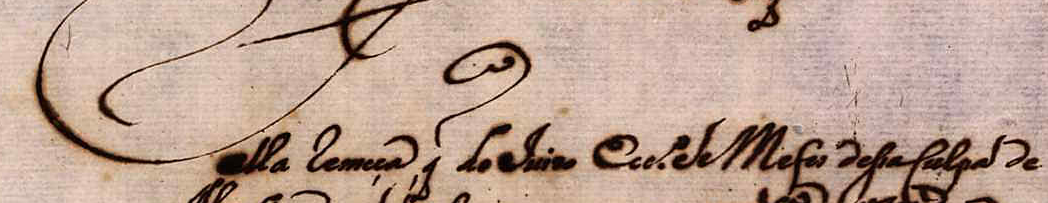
Pella Remeça q̄ do Iuizo Ecc.o se Mefes dessa Culpa de
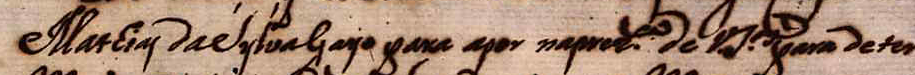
Mathias da Sylva Gayo para apor na prez.te de VS.as para de ter
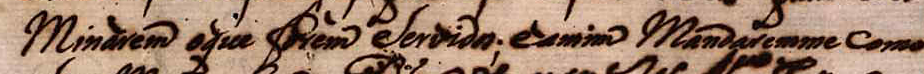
Minàrem o que forem Servidos; e a mim Mandaremme como
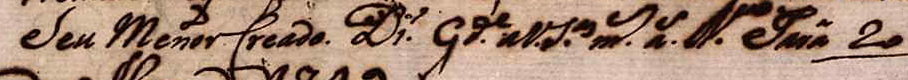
Seu Menor Creado. Ds̄. Gd.e a V. S.as m̄. a.s V.a Pará 20
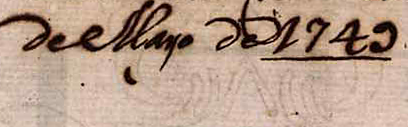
de Mayo de 1749
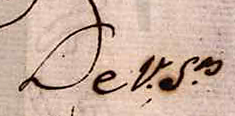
De V. S.as
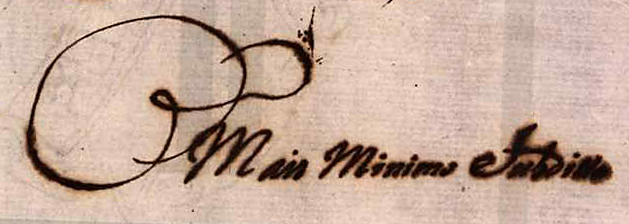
O Mais Minimo Subdito
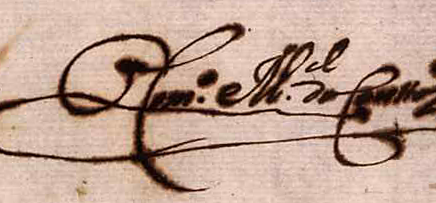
O Com.o Mel de Castro
